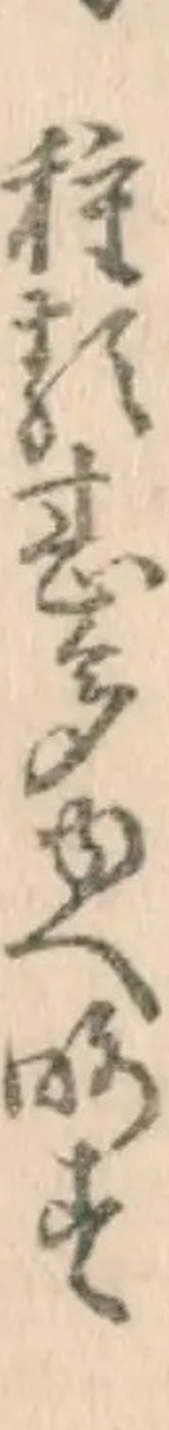種類甚多ゆへ略す
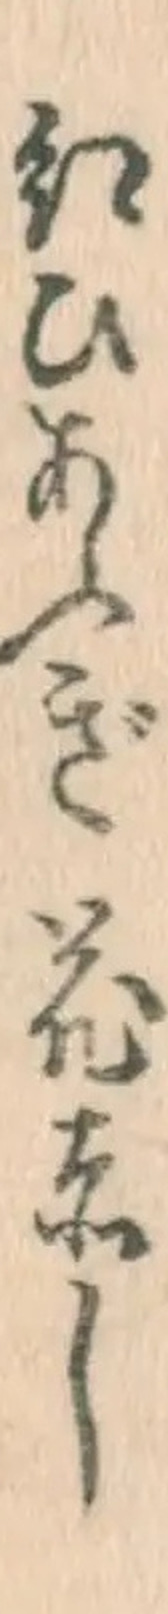紅ひあふぎ花赤し
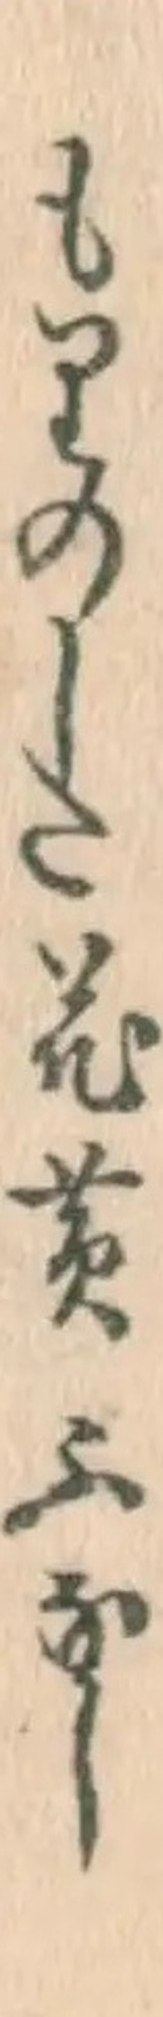もりのした花黄ふし
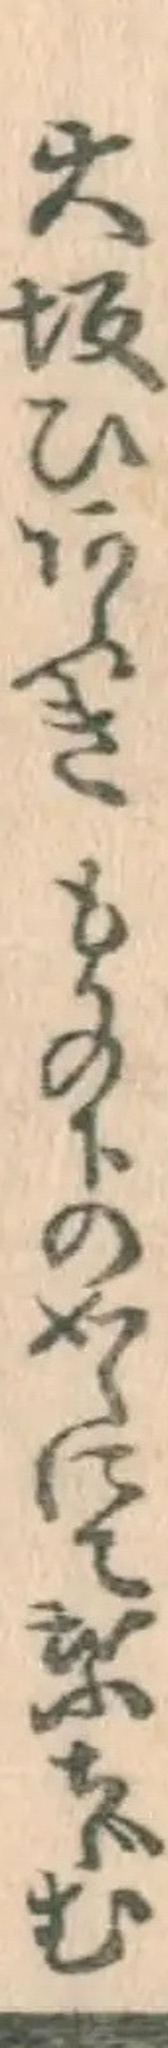大坂ひあふぎもりの下のやうにて葉ちゞむ
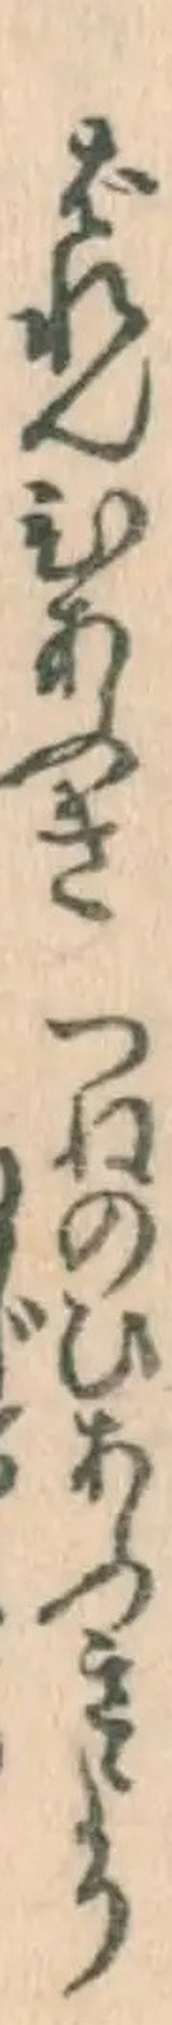ぐれんひあふぎつねのひあふぎより
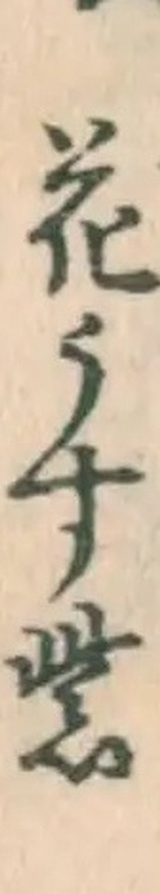花うす紫
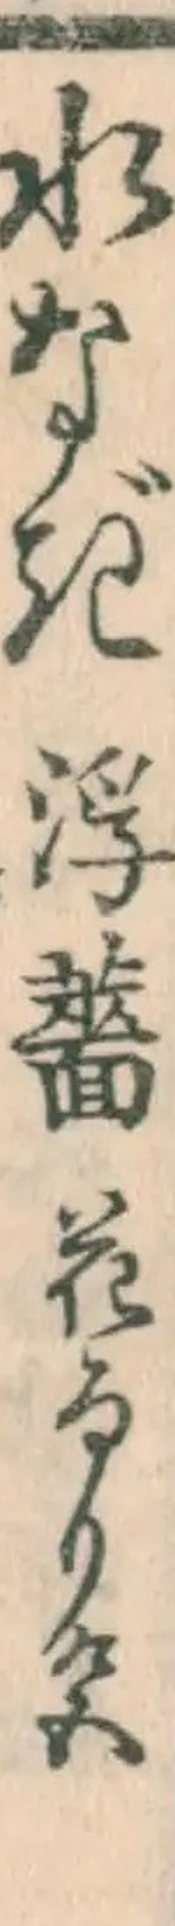水なぎ浮花るり黄
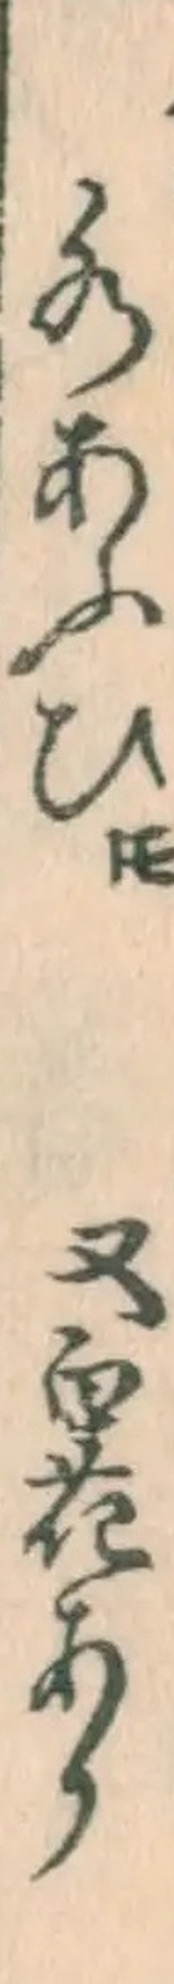水あふひ共又白花あり
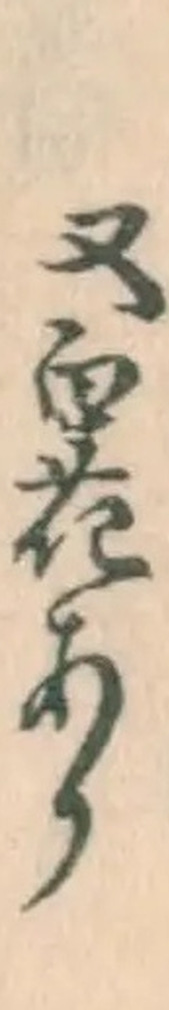又白花あり
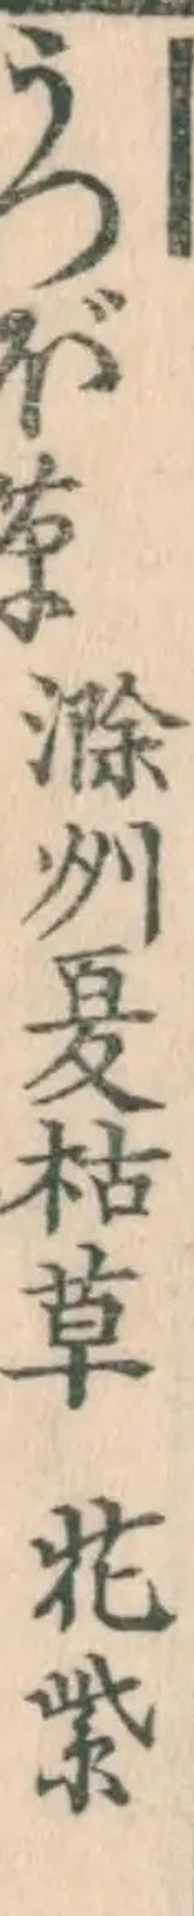うつぼ菜滁州夏枯草花紫
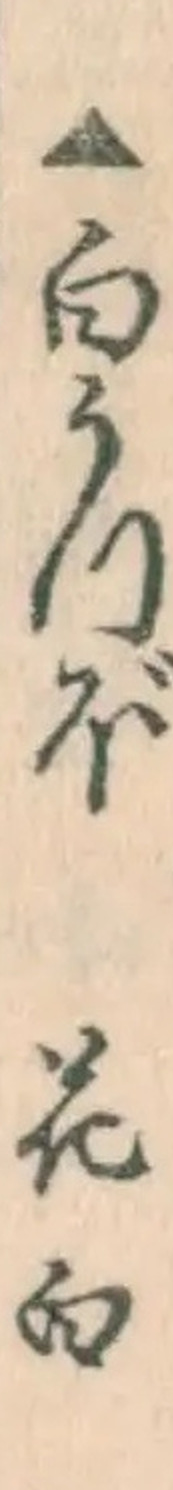▲白うつぼ花白
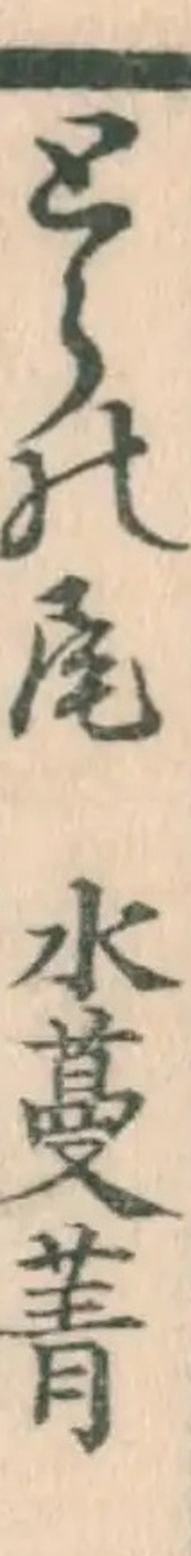とらの尾水蔓
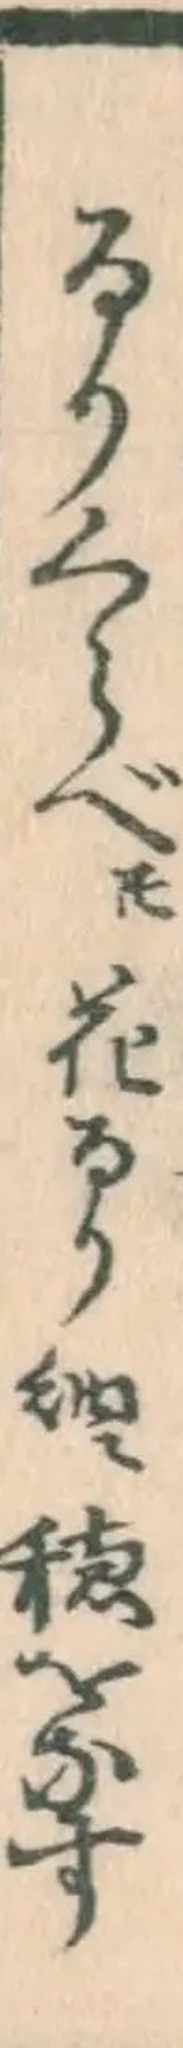るりくらべ共花るり穂をなす
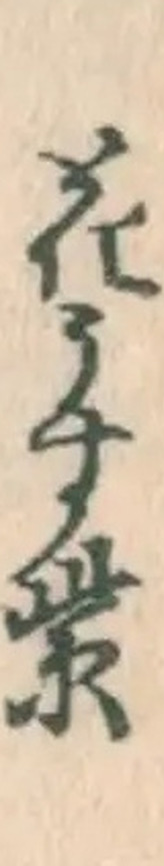花うす紫
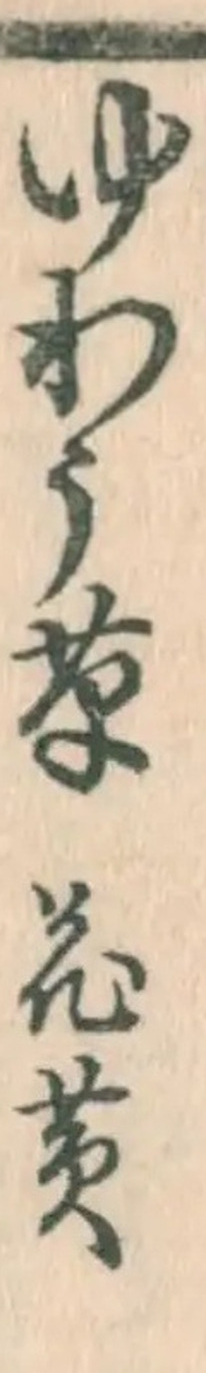ゆわう菜花黄
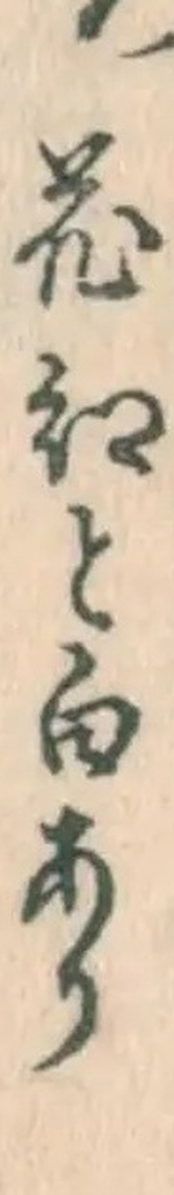花紅と白あり
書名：茶席挿花集
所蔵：国立国会図書館 National Diet Library, JAPAN
